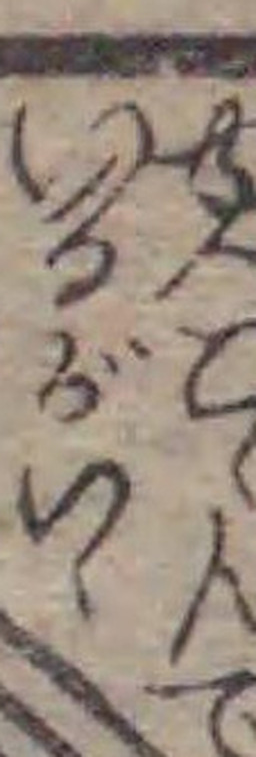いるがいゝ
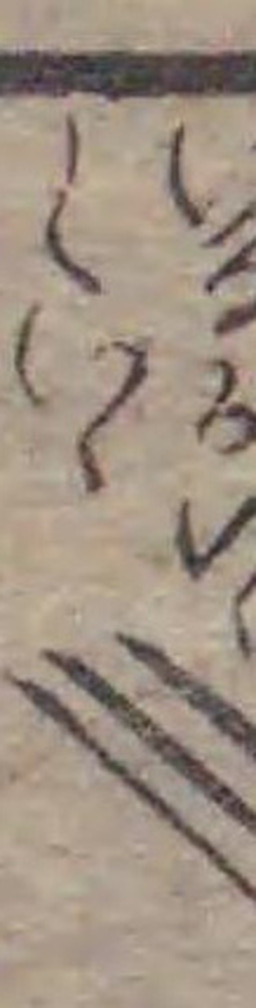しいゝ
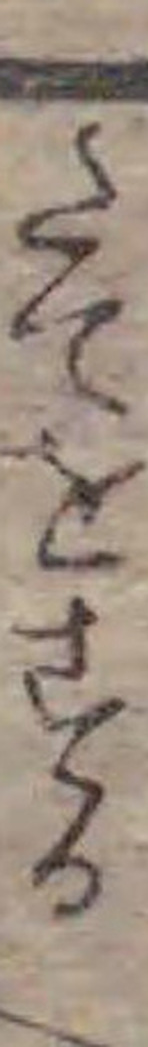たてをする
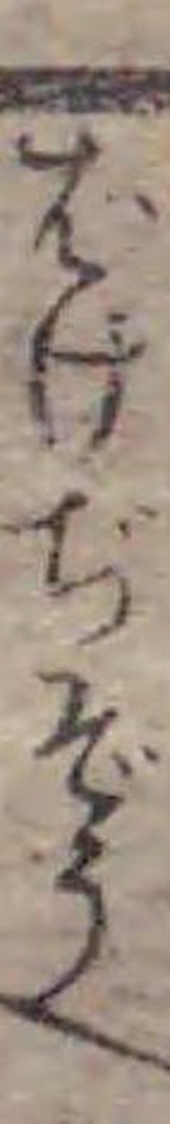ばけぢぞう
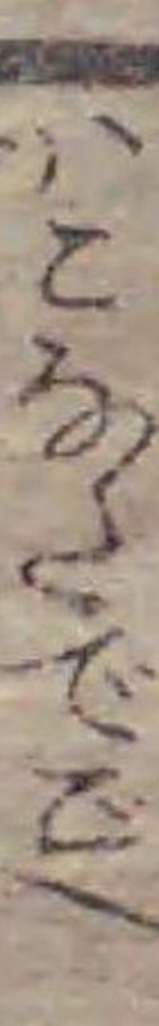はこなたでご
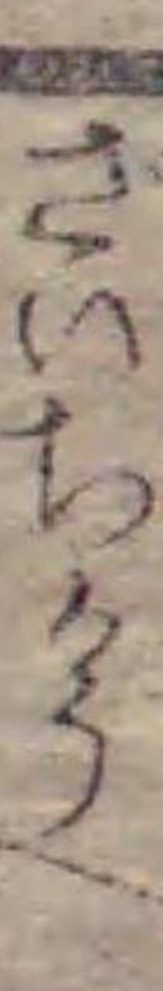ざいちかう
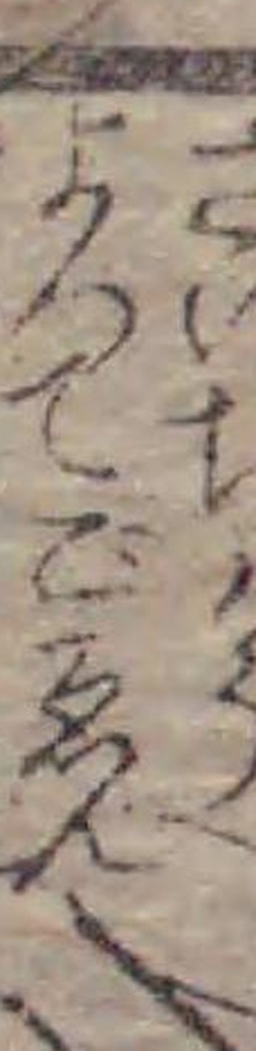よつてごゑん
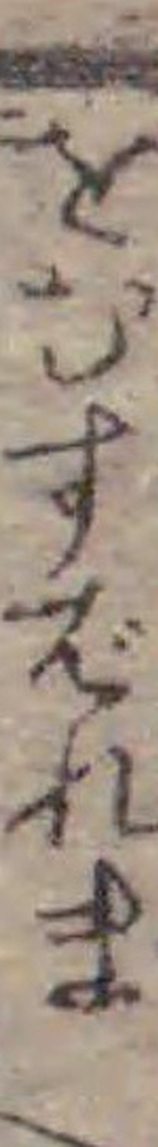をむすばれま
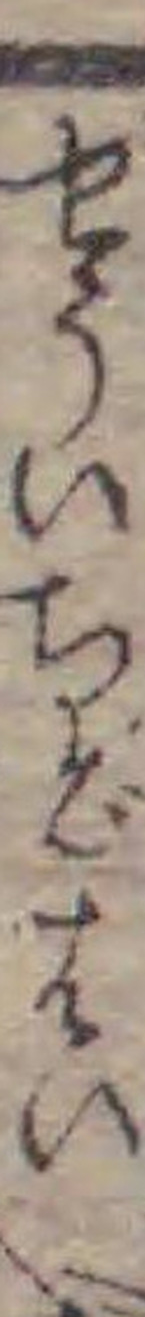せういちどはい
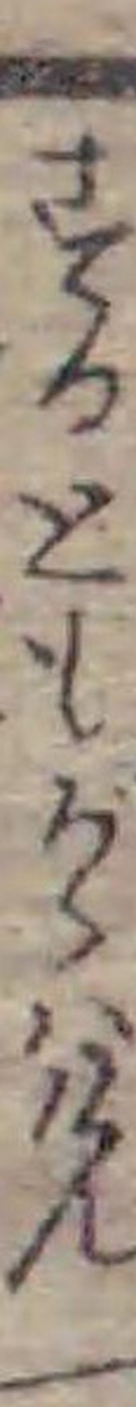するともがらはけん
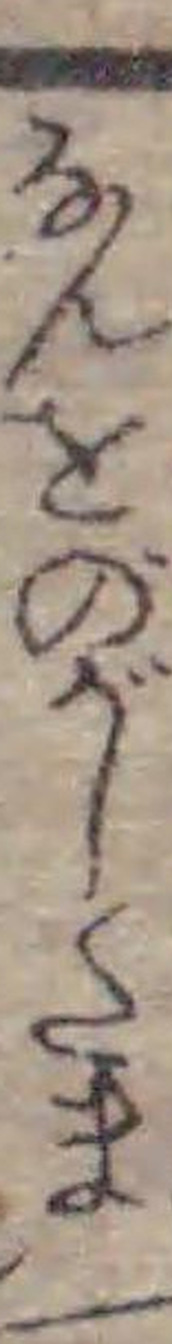なんをのがしたま
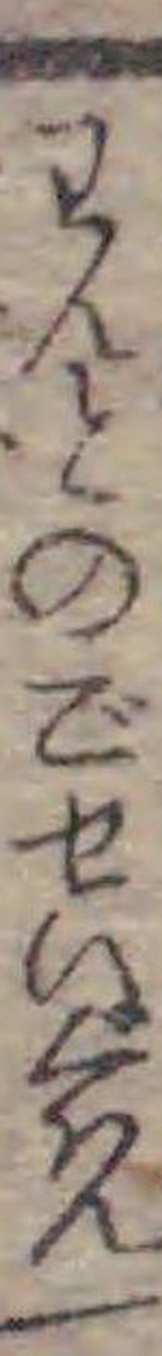わんとのごせいぐわん
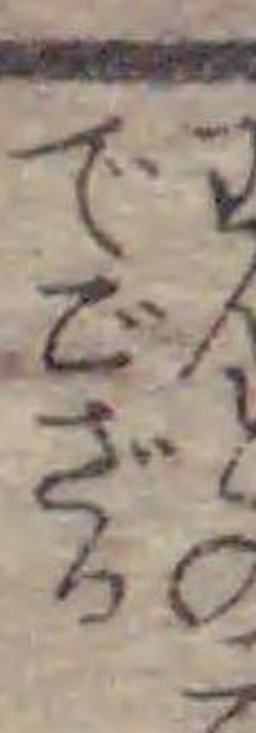でござる
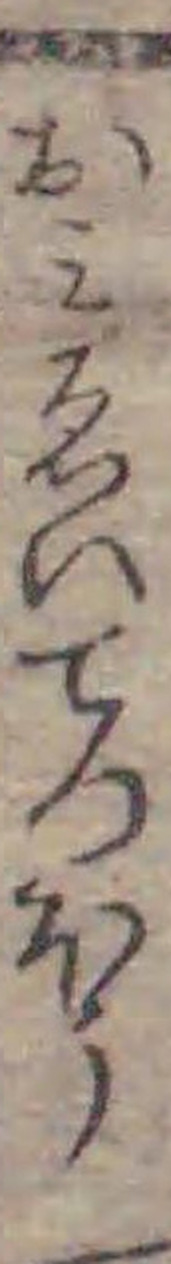おみゑいてつほう
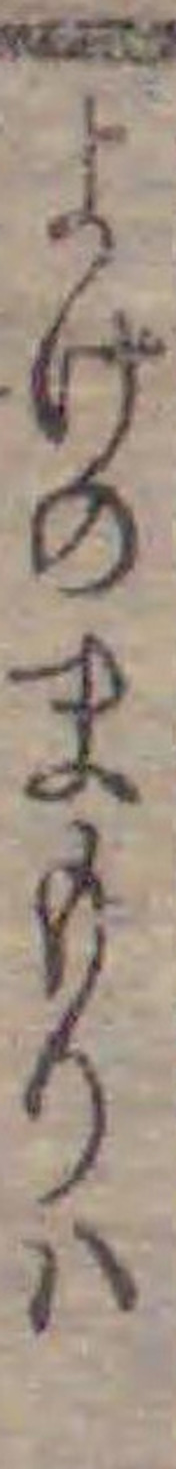よけのまもりは
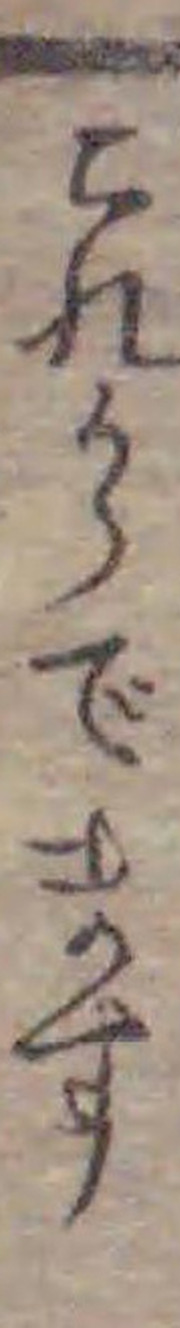これからでます
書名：化物七段目 : 2巻
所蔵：国立国会図書館 National Diet Library, JAPAN
